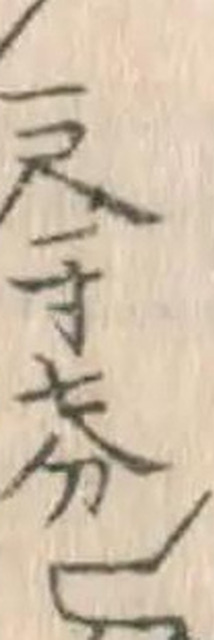一尺一寸七分
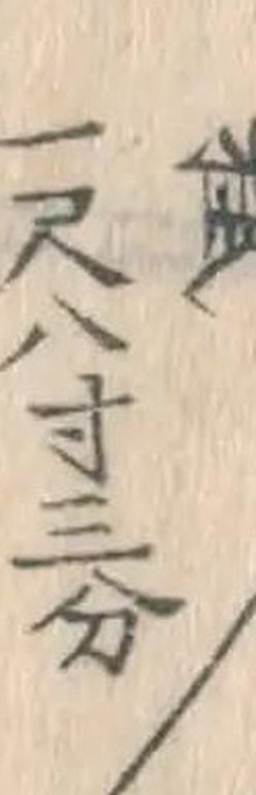一尺八寸三分
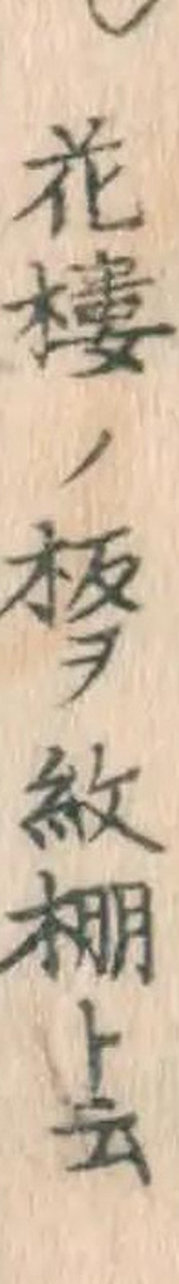花楼ノ板ヲ紋棚ト云
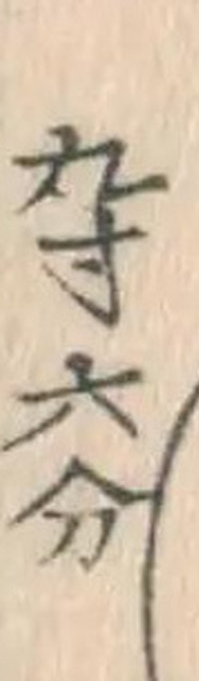九寸六分

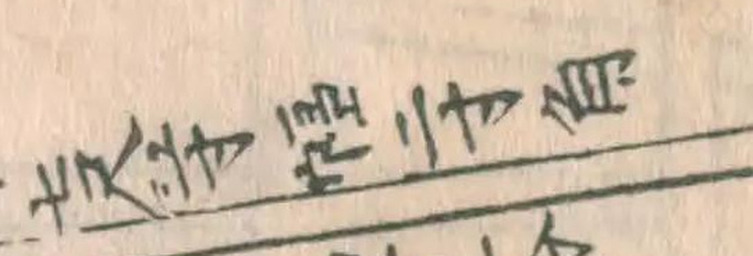仕ツギ七尺寸幅二寸角
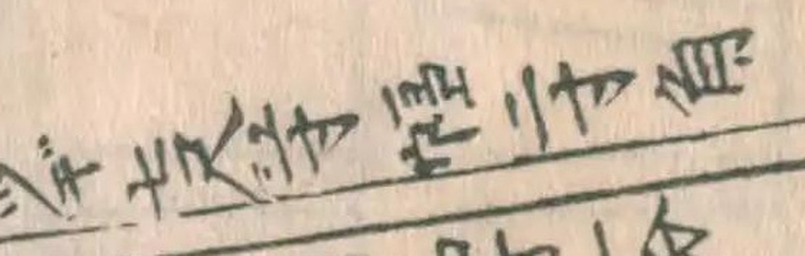仕ツギ七尺寸幅二寸角
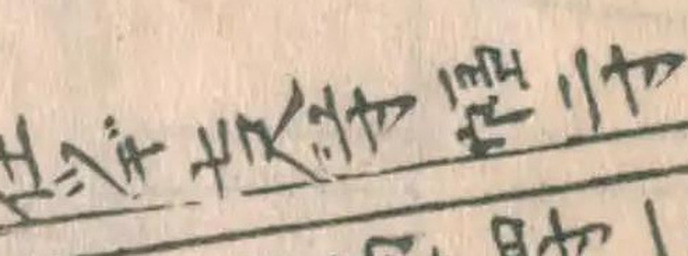仕ツギ七尺寸幅二寸角
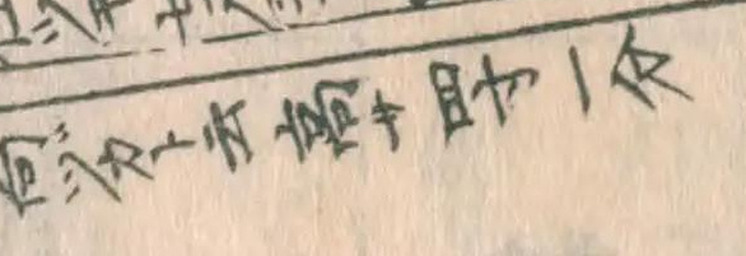向ヅカト云高サ四寸一分
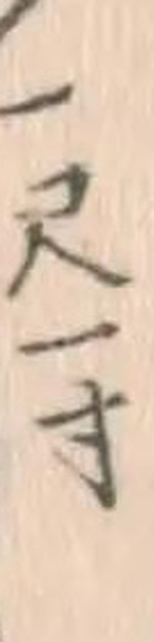一尺六寸
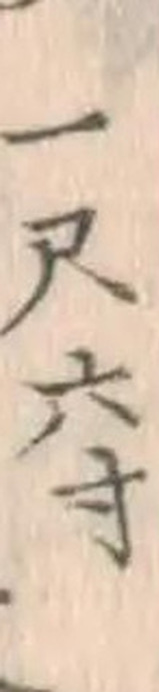一尺六寸
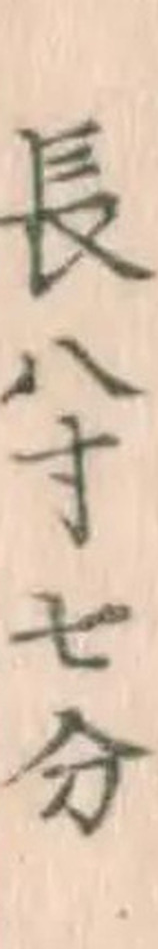長八寸七分
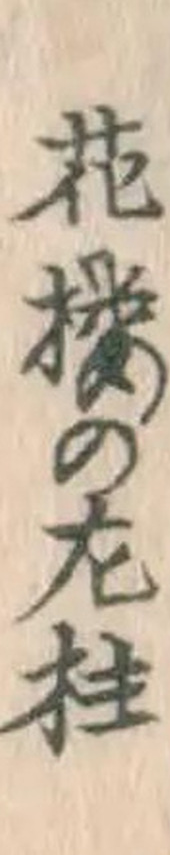花楼の左柱
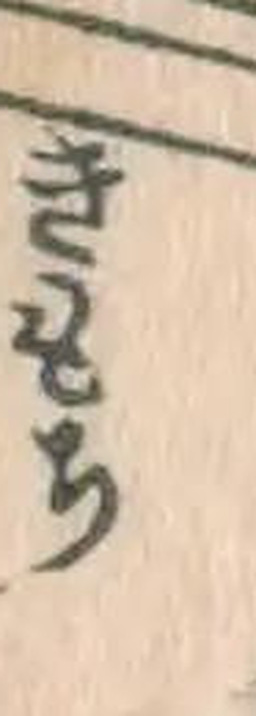きもち

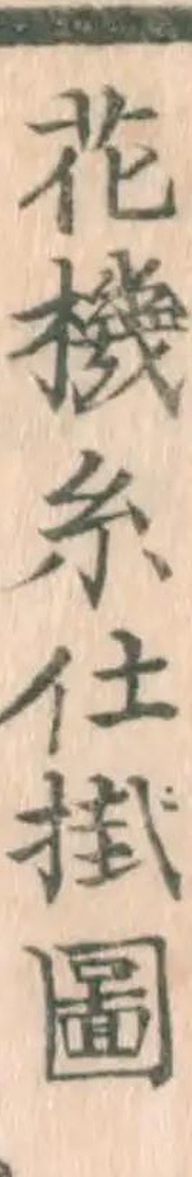花機糸仕掛図
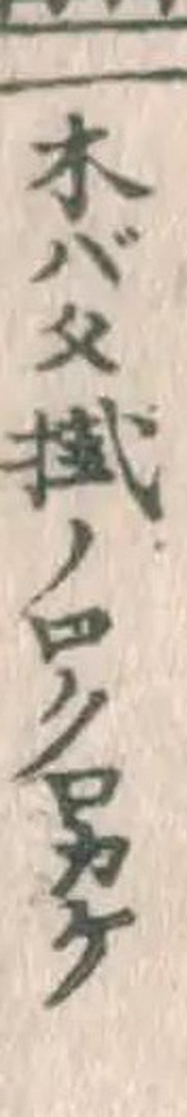木バタ掛ノロクロカケ
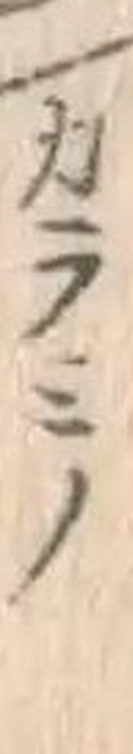カラミ糸
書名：機織彙編 5巻. [1]
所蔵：国立国会図書館 National Diet Library, JAPAN
